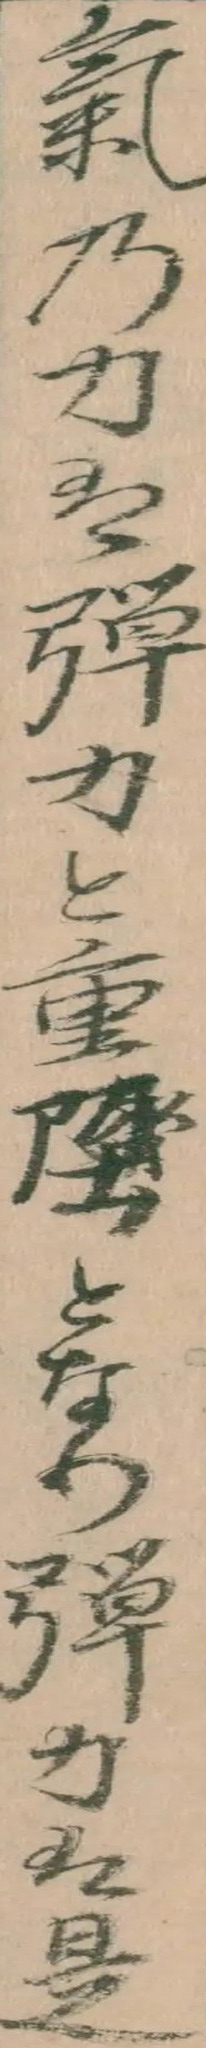気の力は弾力と重墜となり弾力は是
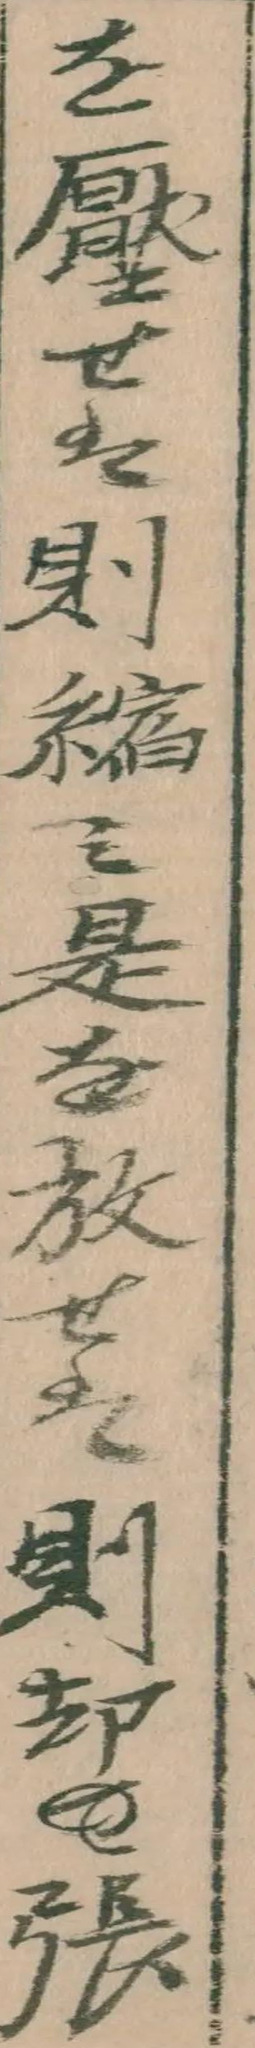を圧せは則縮み是を放せは則却張
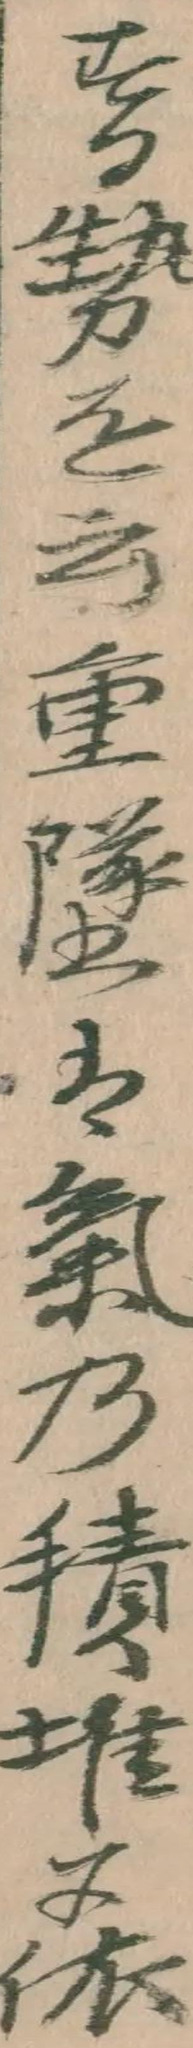する勢を云重墜は気の積堆に依
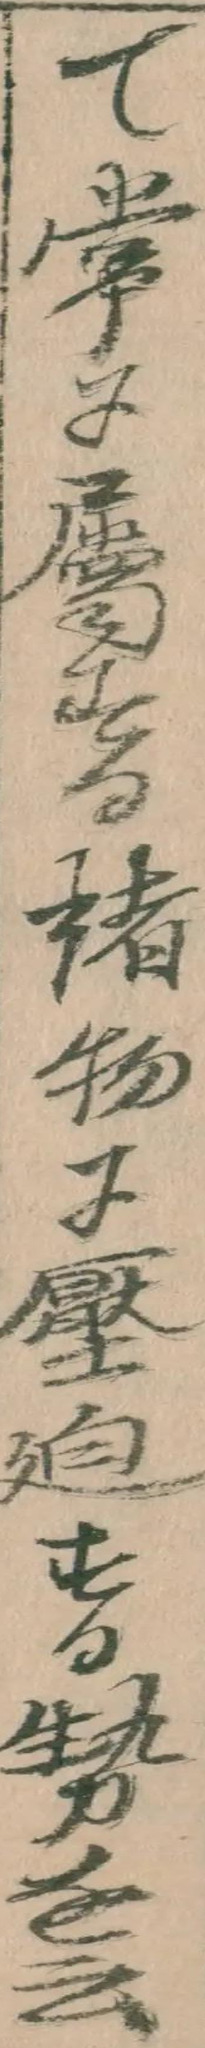て常に属する諸物に圧迫する勢を云
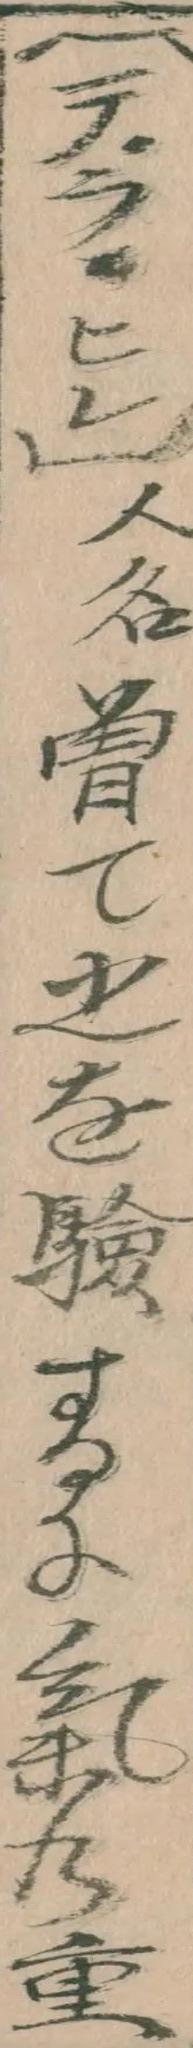(テ・ラ・ヒレ)人名曽て之を験するに気の重
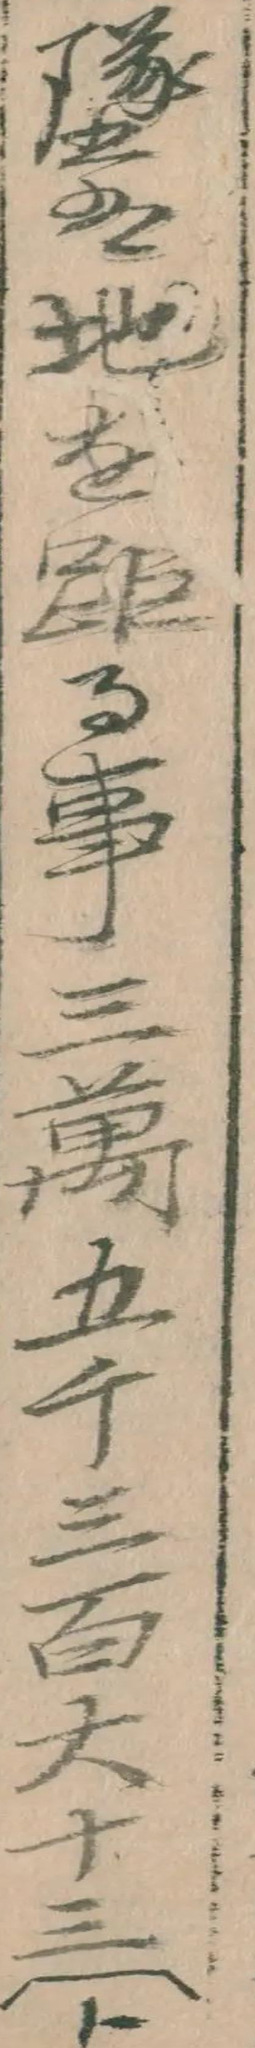墜は地を距る事三万五千三百六十三(ト
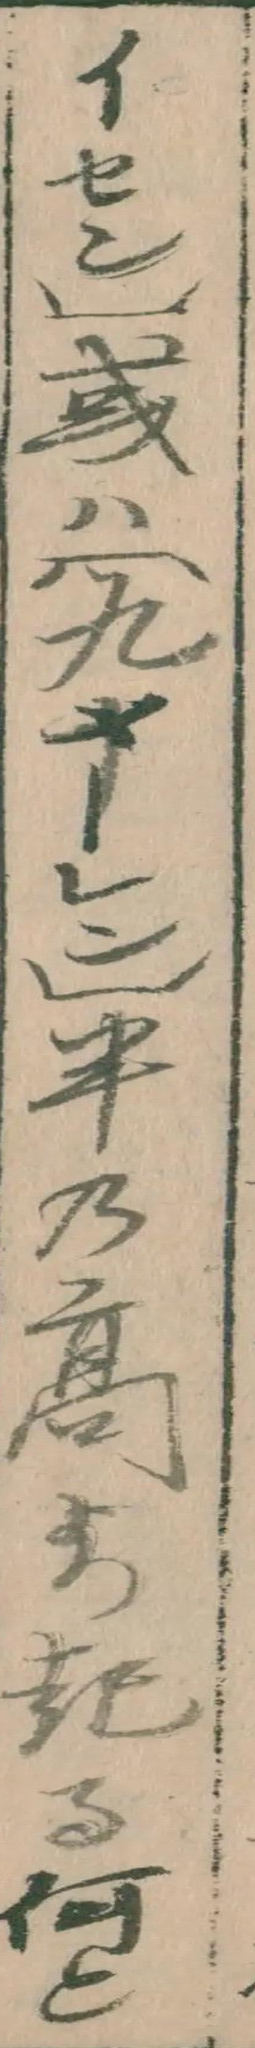イセン)或ハ(九メーレン)半の高より起る何と

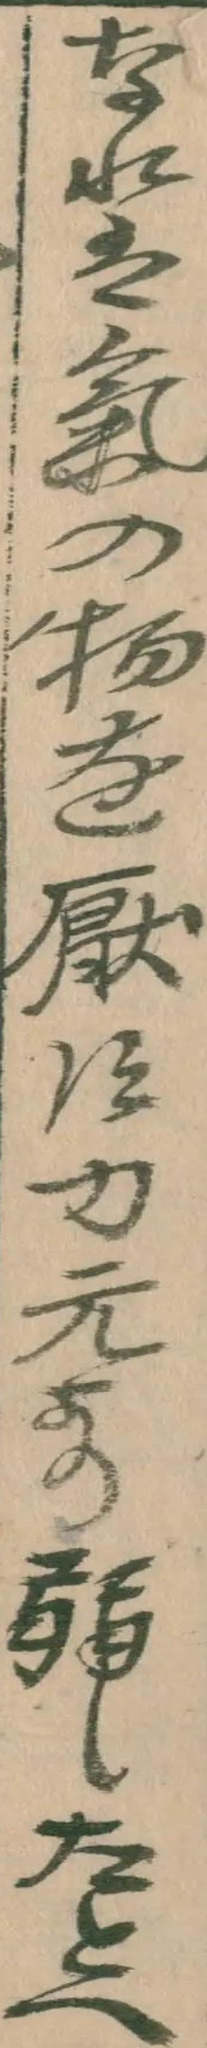なれす気の物を圧す力元より弱したとへ
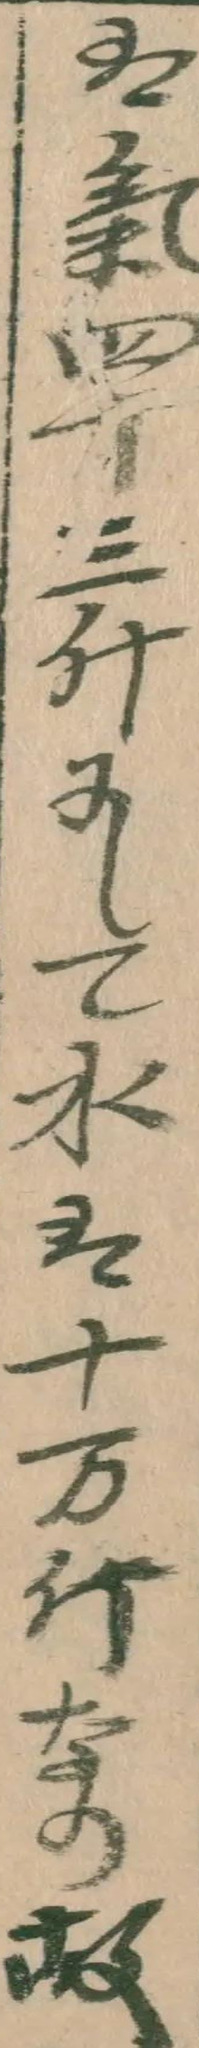は気四十三升にして水は十万升なり故
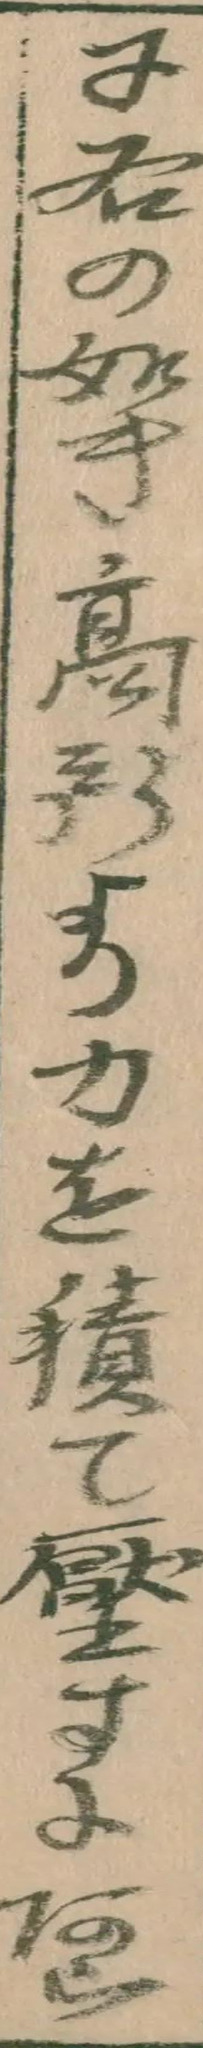に右の如き高所より力を積て圧するあら
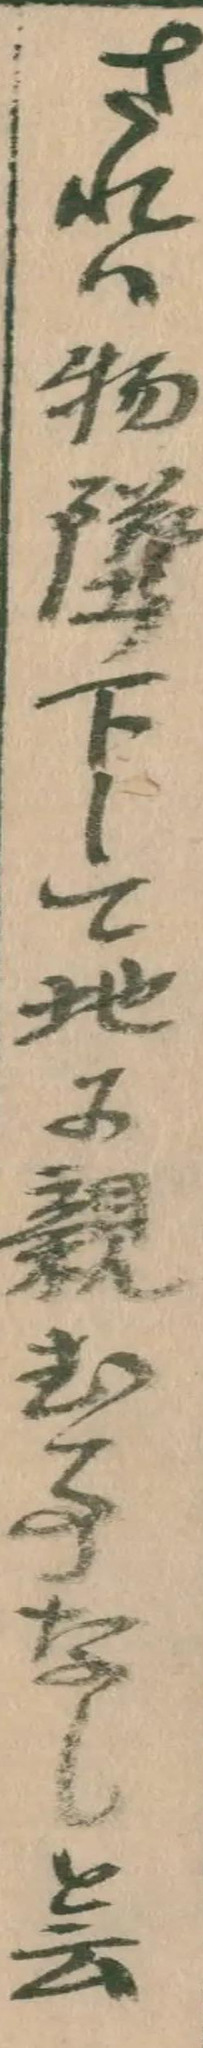されは物墜下して地に親む事なしと云
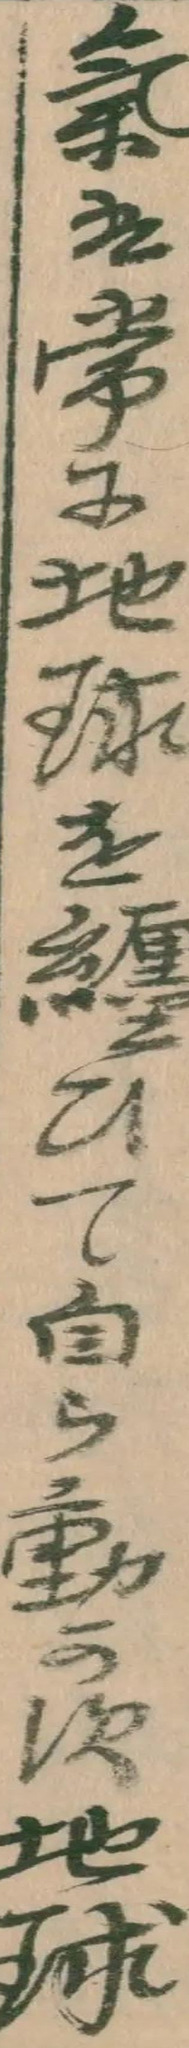気は常に地球を纏ひて自ら動かす地球
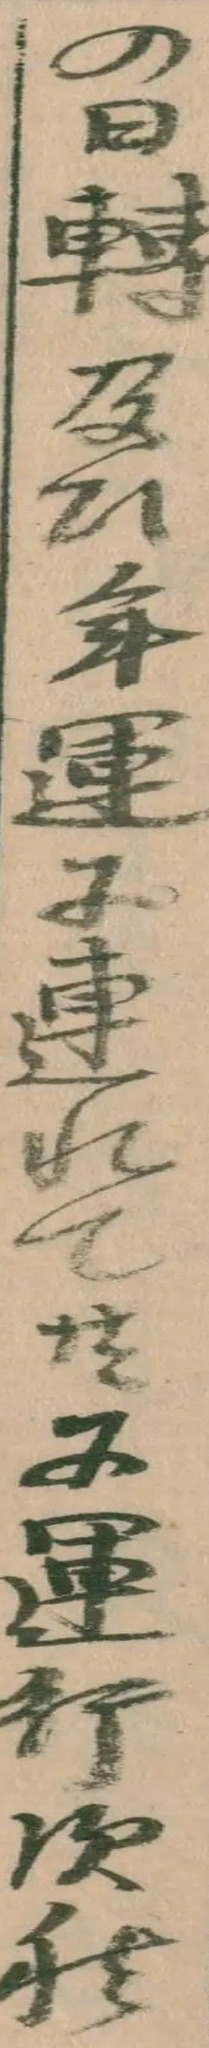の日転及ひ年運に連れて其に運行す然
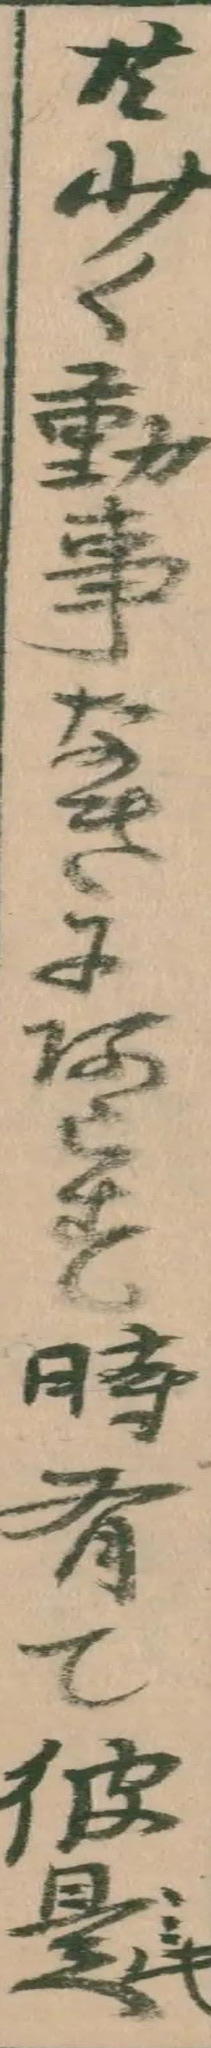共少く動事なきにあらす時有て彼是
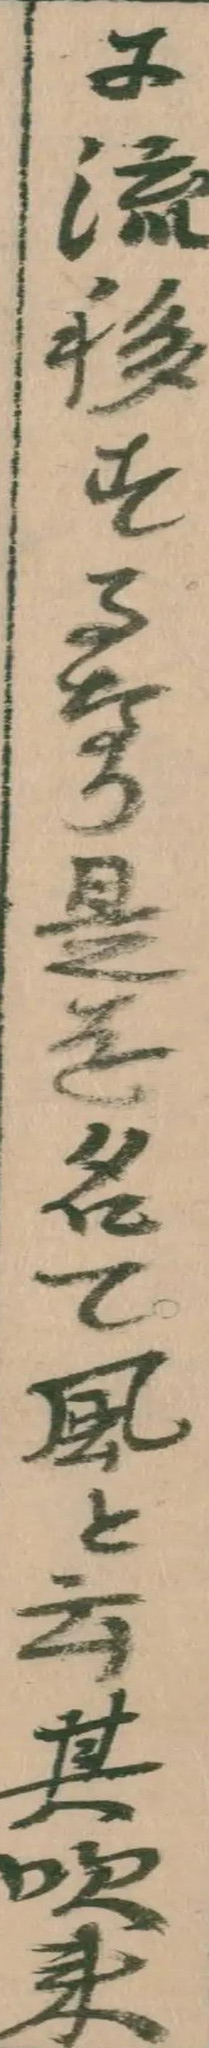に流移するなり是を名て風と云其吹来
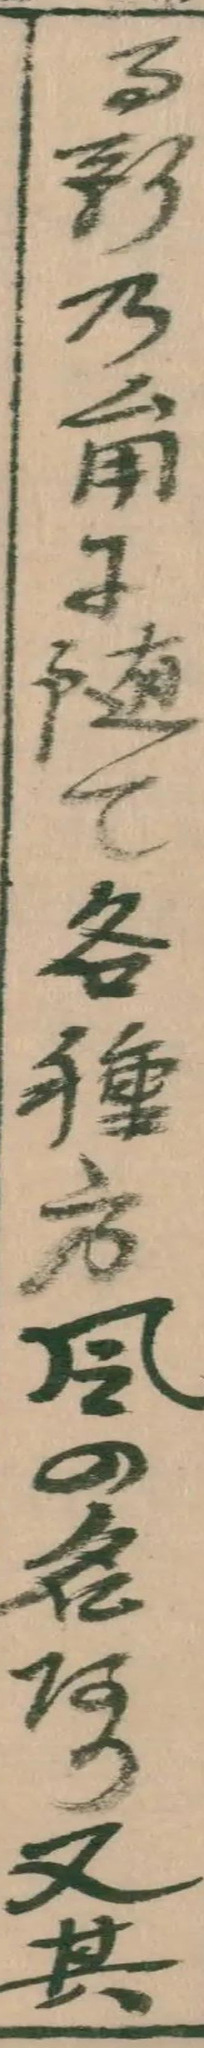る所の角に随て各種方風の名あり又其
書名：新釈輿地図説
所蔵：国立国会図書館 National Diet Library, JAPAN
